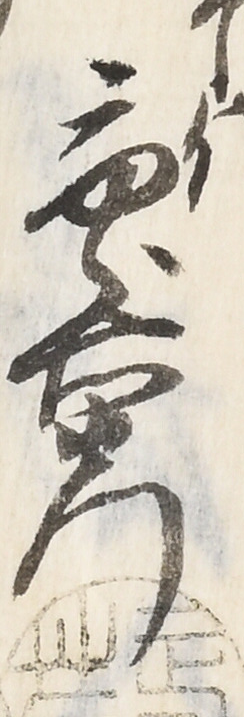甚右衛門
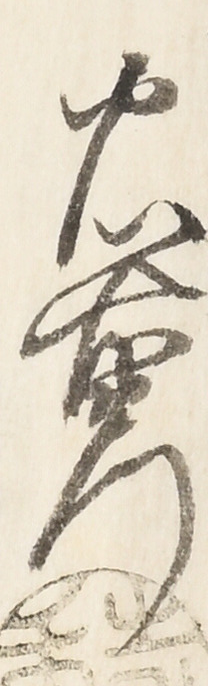甚右衛門
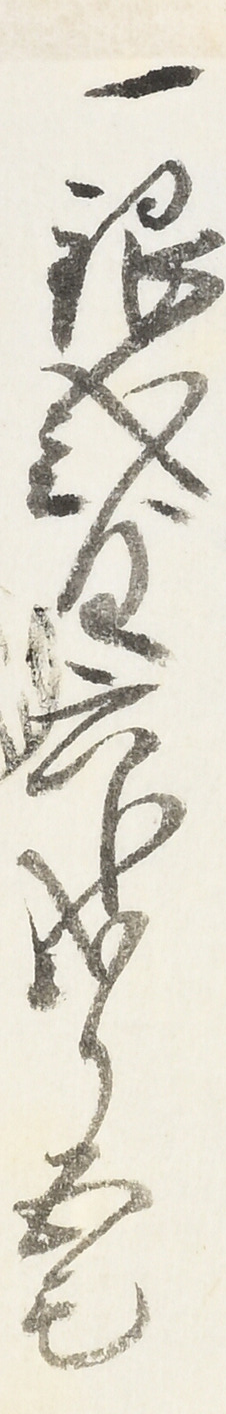一銀弐匁六分弐厘五毛
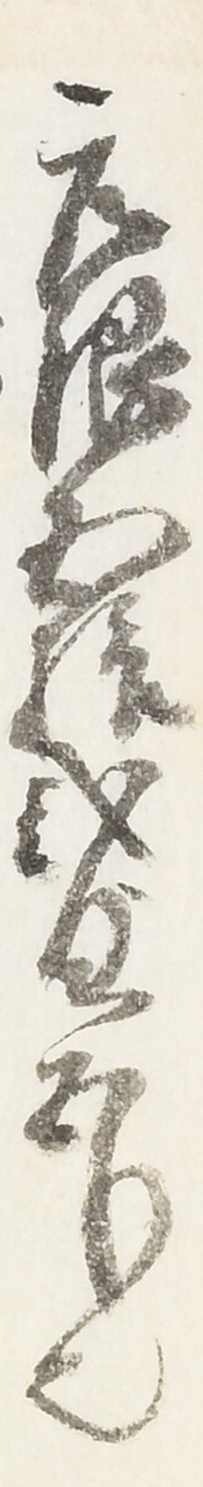元銀五拾弐匁五分也
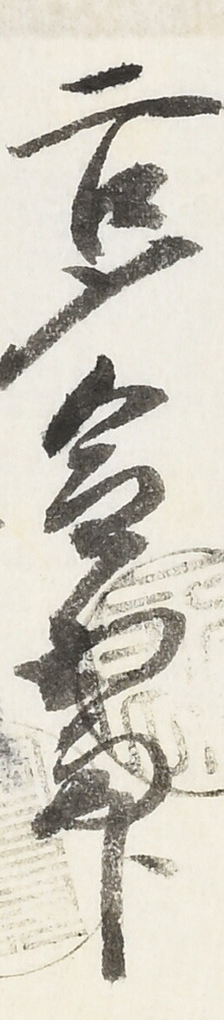二口〆金五両ト
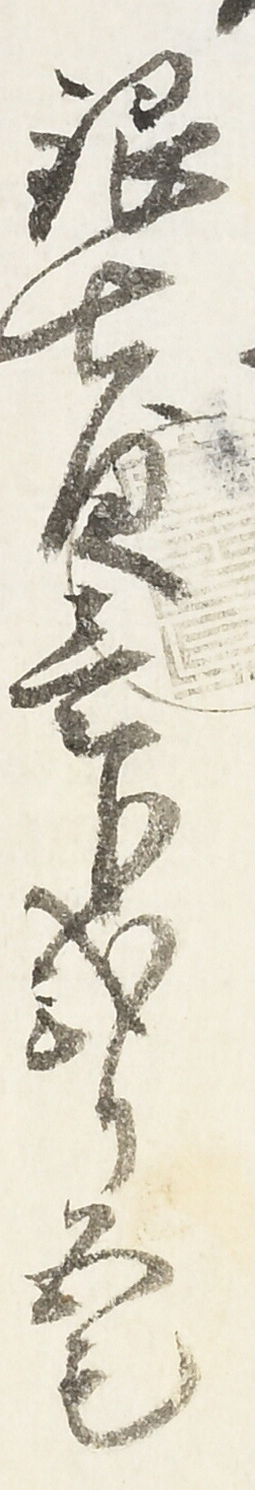銀七匁壱分弐厘五毛
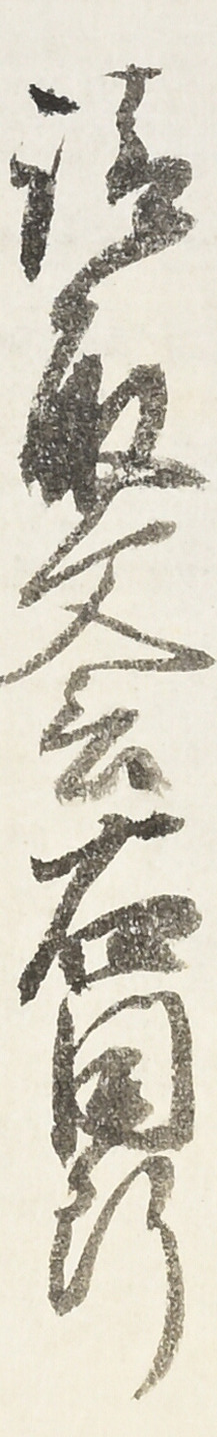請取文言右同断
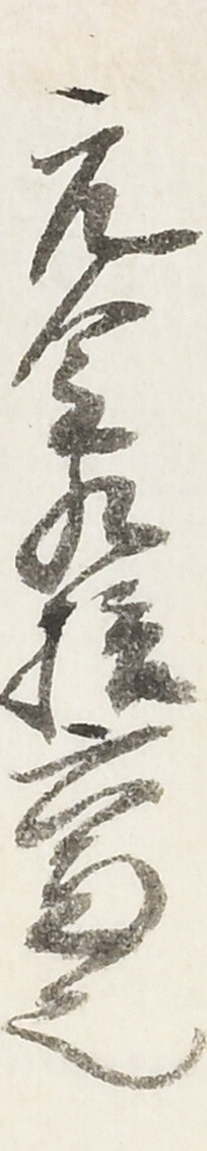元金九拾六両也
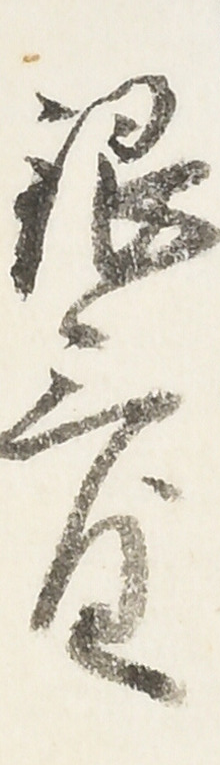銀三匁
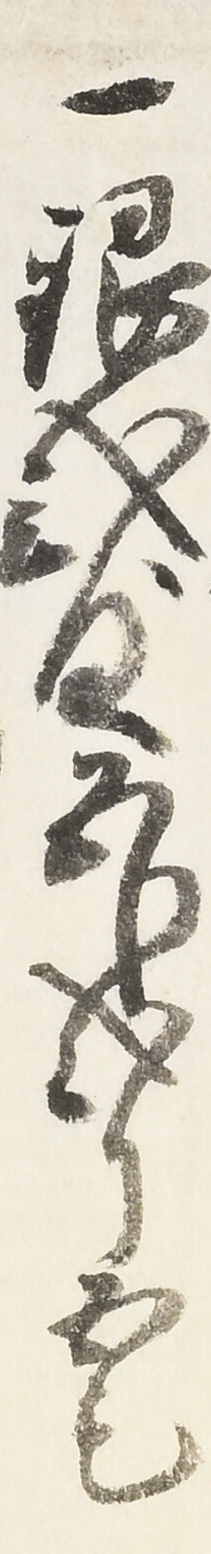一銀弐匁五分弐厘五毛
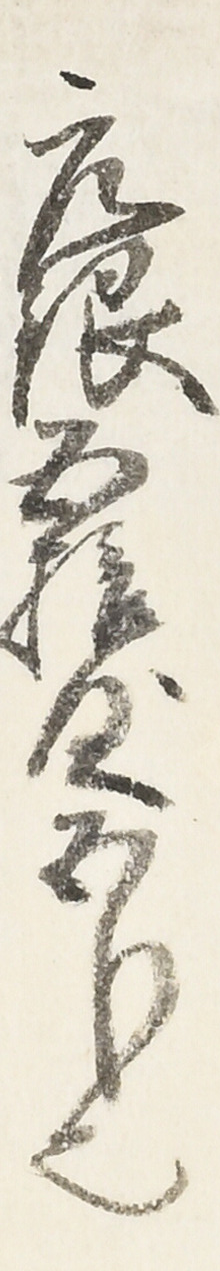元銀五拾匁五分也
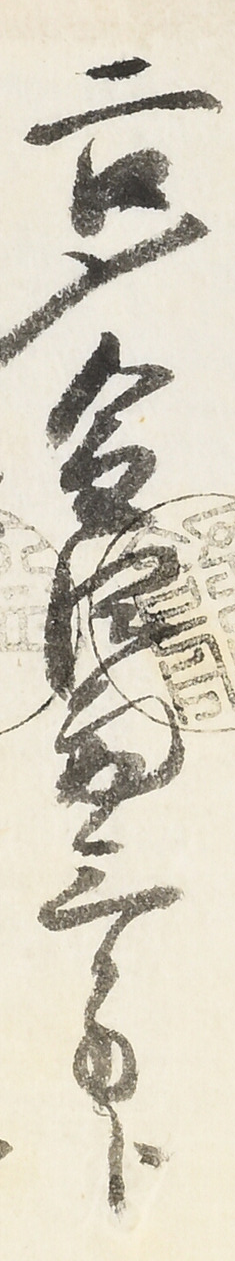二口〆金四両三分ト
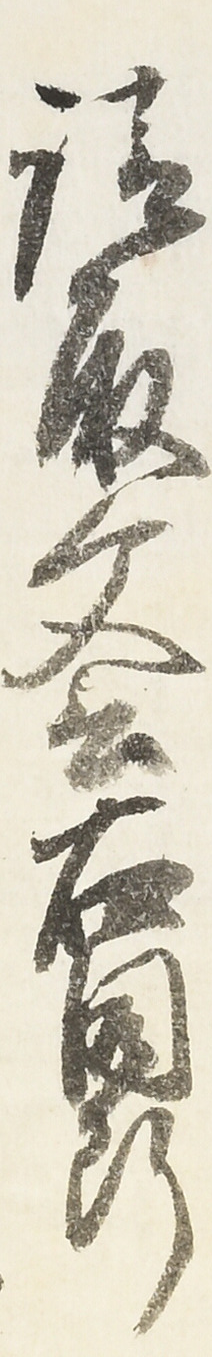請取文言右同断
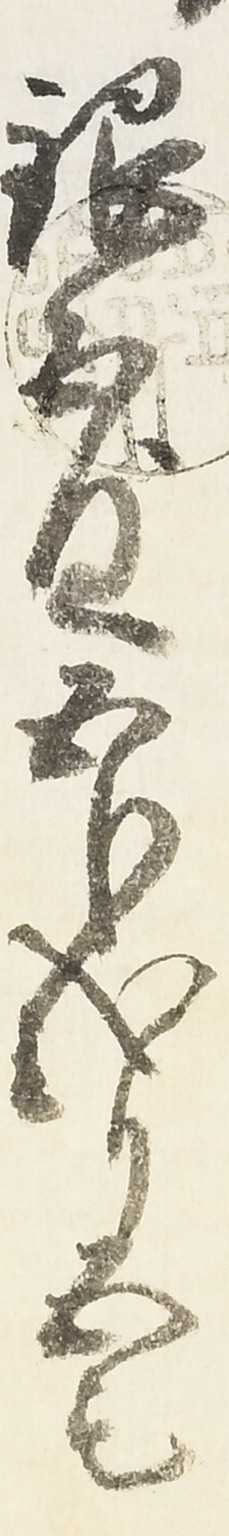銀五匁五分弐厘五毛
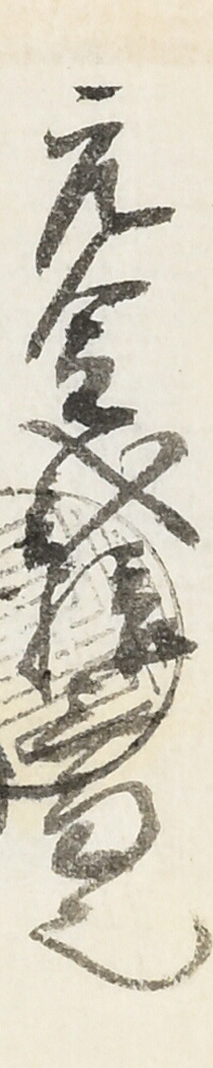元金弐拾三両也
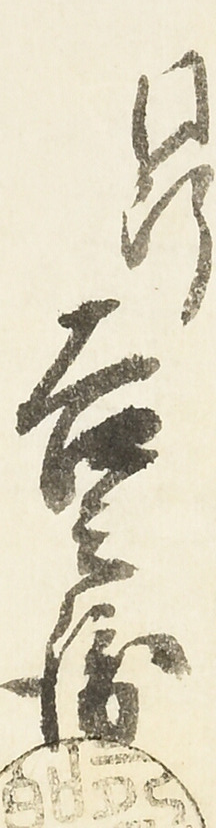吉兵衛
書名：御才覚金御利足割渡扣帳
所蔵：伊那市立高遠町図書館・合同会社AMANE
